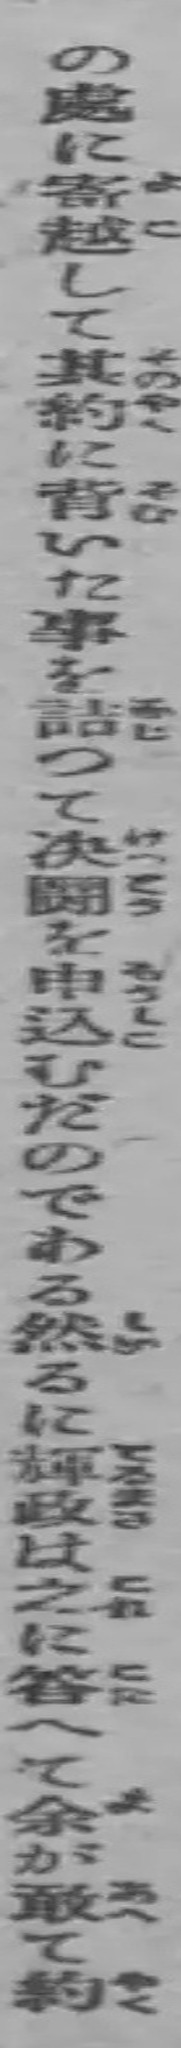の処に寄越して其約に背いた事を詰つて決闘を申込むだのである然るに輝政は之に答へて余が敢て約
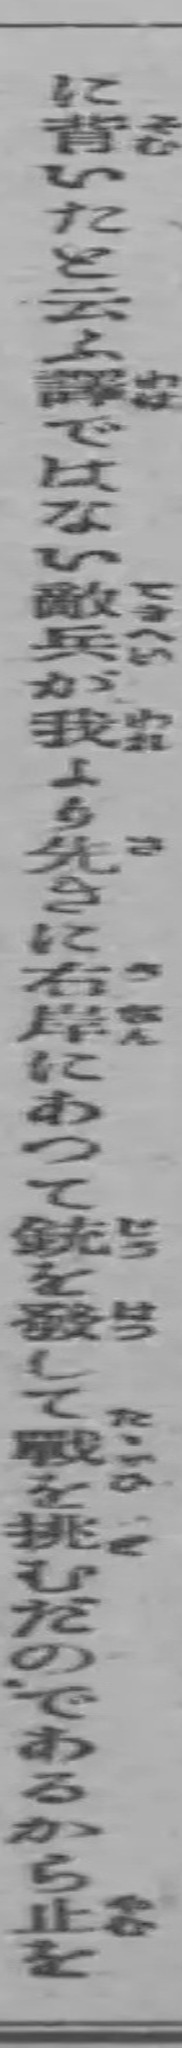に背いたと云ふ訳ではない敵兵が我より先きに右岸にあつて銃を発して戦を挑むだのであるから止を
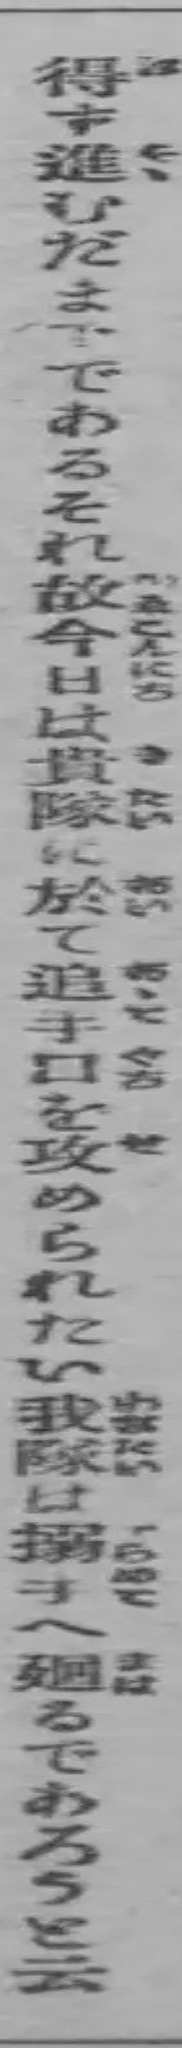得ず進むだまでであるそれ故今日は貴隊に於て追手口を攻められたい我隊は搦手へ廻るであろうと云
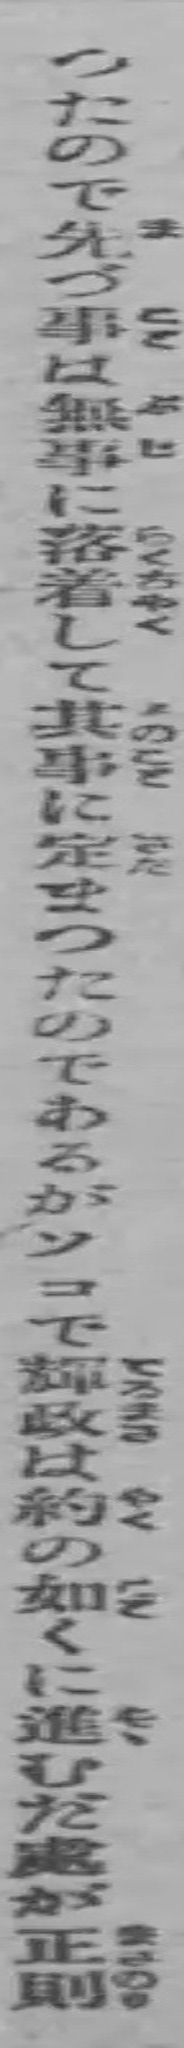つたので先づ事は無事に落着して其事に定まつたのであるがソコで輝政は約の如くに進むだ処が正則
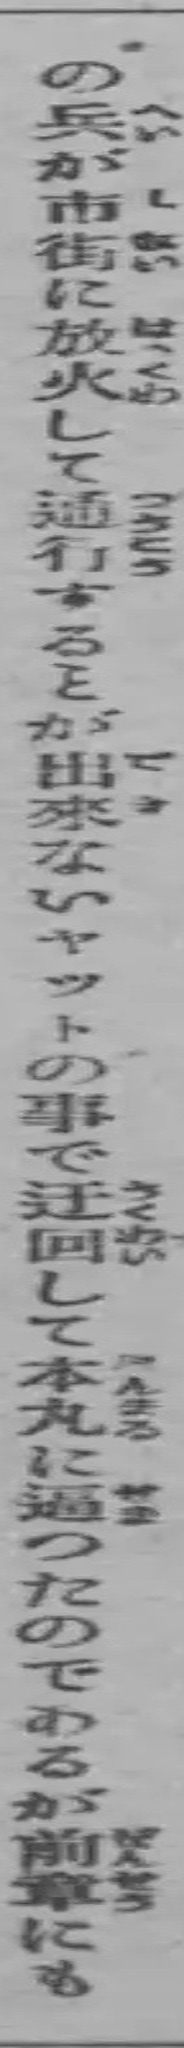の兵が市街に放火して通行することが出来ないヤツトの事で迂回して本丸に逼つたのであるが前章にも
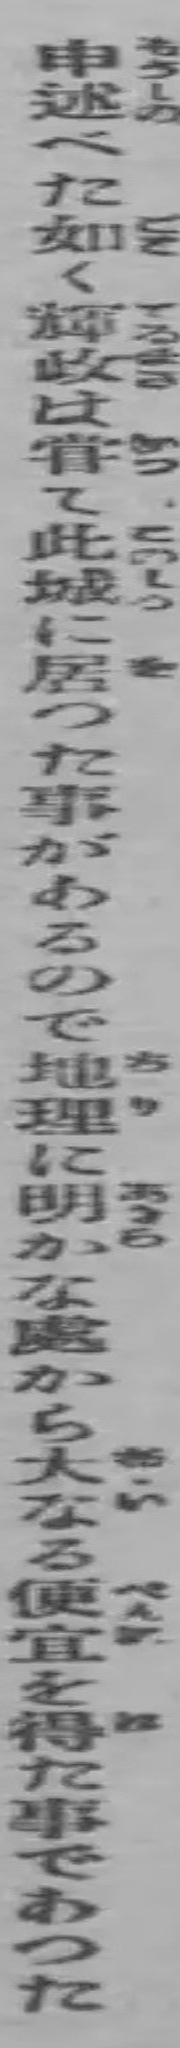申述べた如く輝政は嘗て此城に居つた事があるので地理に明かな処から大なる便宜を得た事であつた
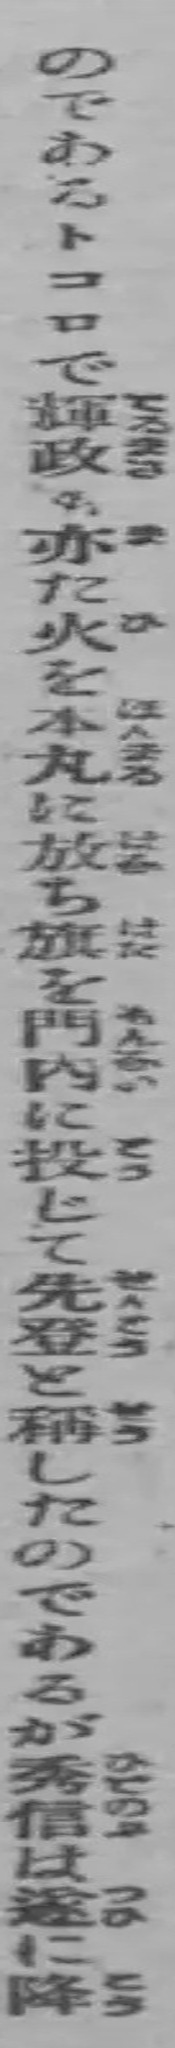織田秀信の請降のであるトコロで輝政も亦た火を本丸に放ち門内に投じて先登と称したのであるが秀信は遂に降
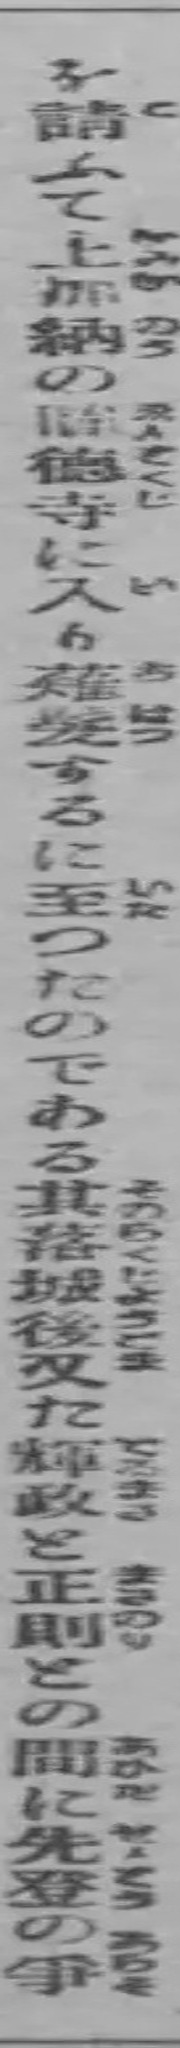を請ふて上加納の円徳寺に入り薙髪するに至つたのである其落城後又た輝政と正則との間に先登の争
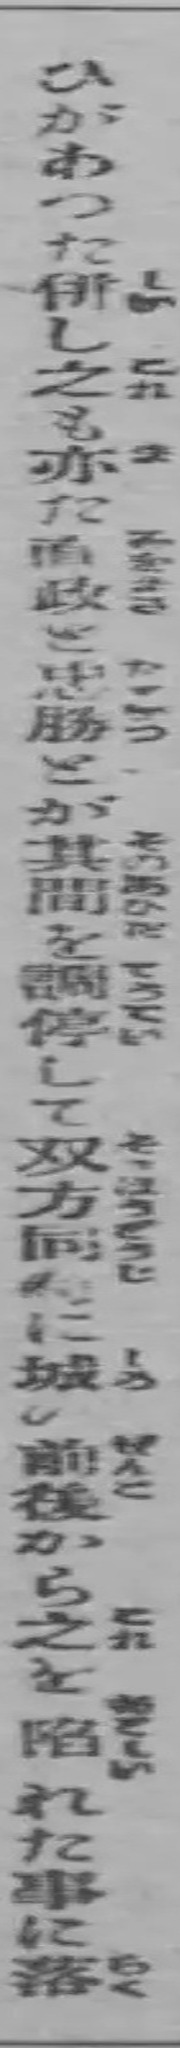ひがあつた併し之も亦た直政と忠勝とが其間を調停して双方同時に城の前後から之を陥れた事に落
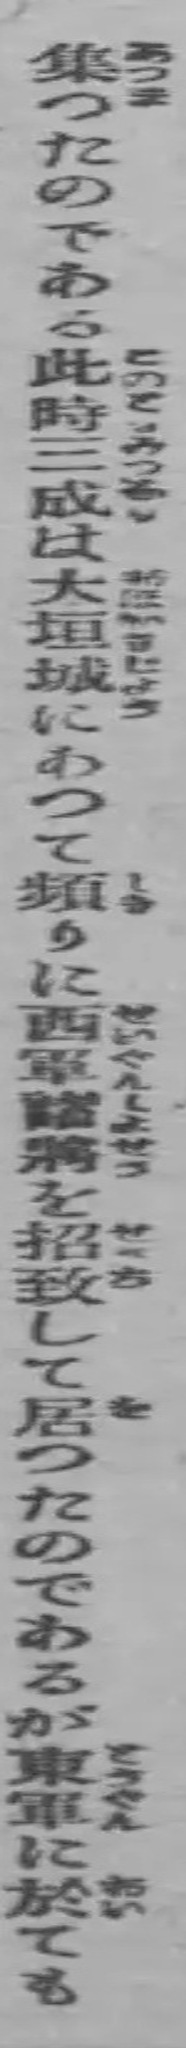集つたのである此時三成は大垣城にあつて頻りに西軍諸将を招致して居つたのであるが東軍に於ても
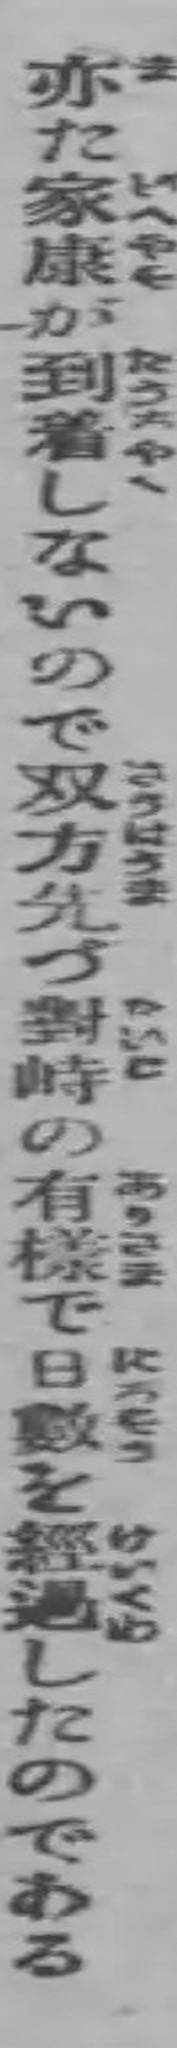亦た家康が到着しないので双方先づ対峙の有様で日数を経過したのである
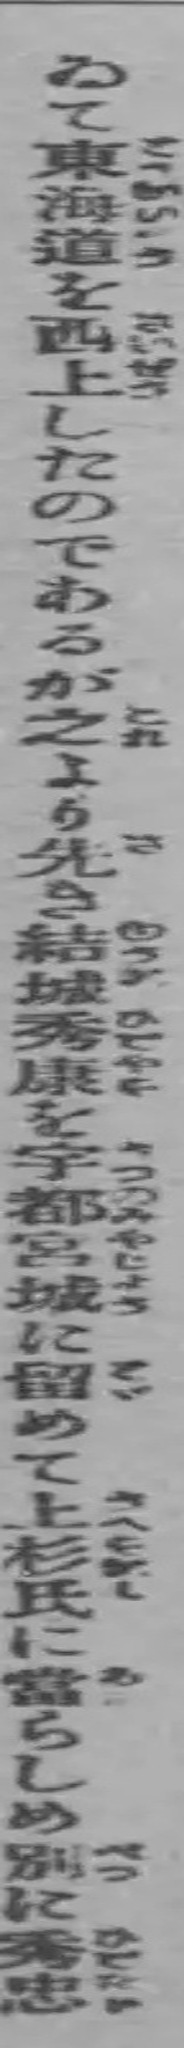ゐて東海道を西上したのであるが之より先き結城秀康を宇都宮城に留めて上杉氏に当らしめ別に秀忠

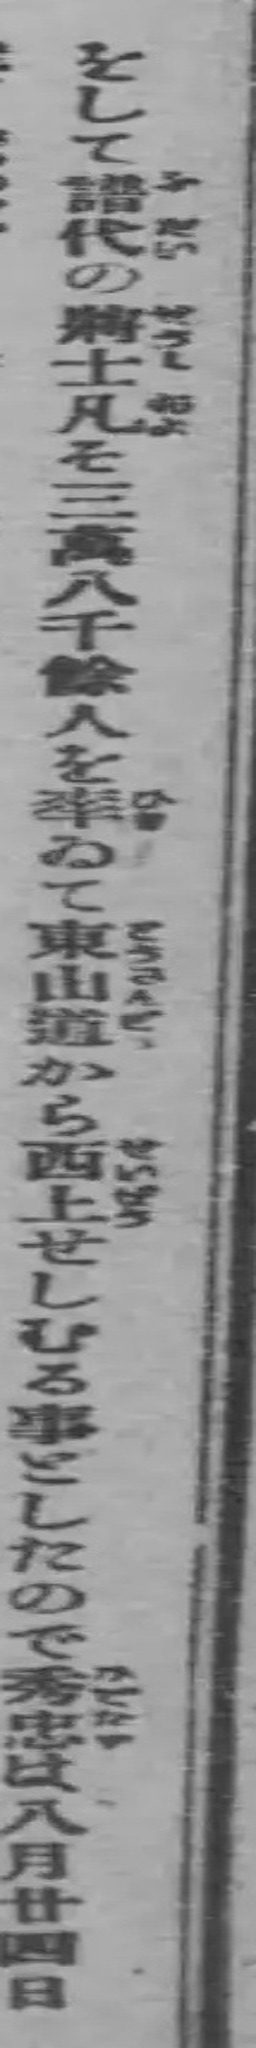をして譜代の将士凡そ三万八千余人を率ゐて東山道から西上せしむる事としたので秀忠は八月廿四日
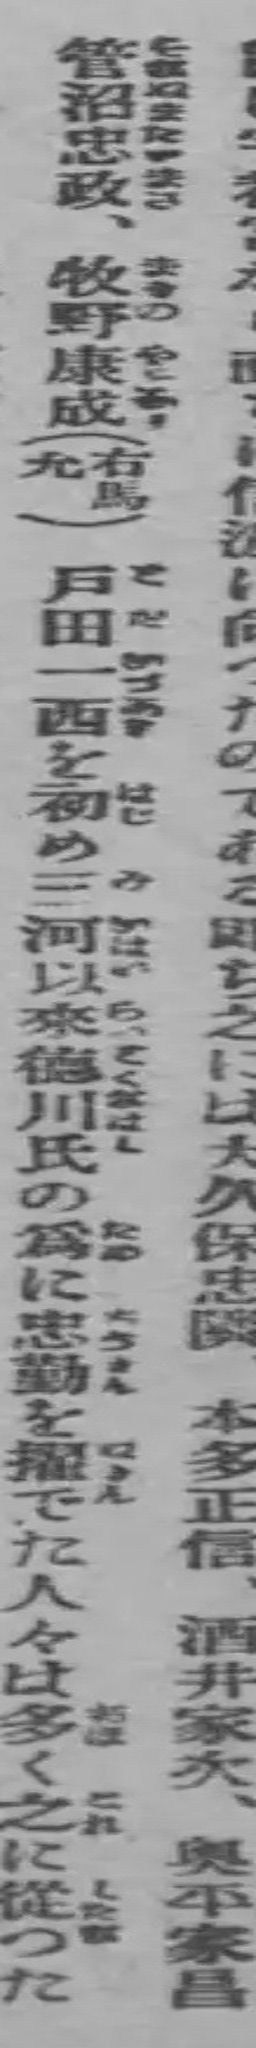菅沼忠政、牧野康成(右馬允)戸田一西を初め三河以来徳川氏の為に忠勤を擢でた人々は多く之にしたが従つた
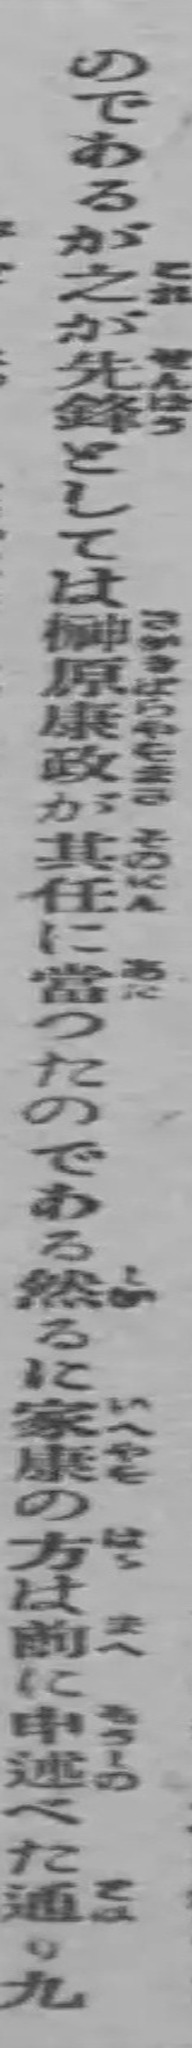のであるが之が先鋒としては榊原康政が其任に当つたのである然るに家康の方は前に申述べた通り九
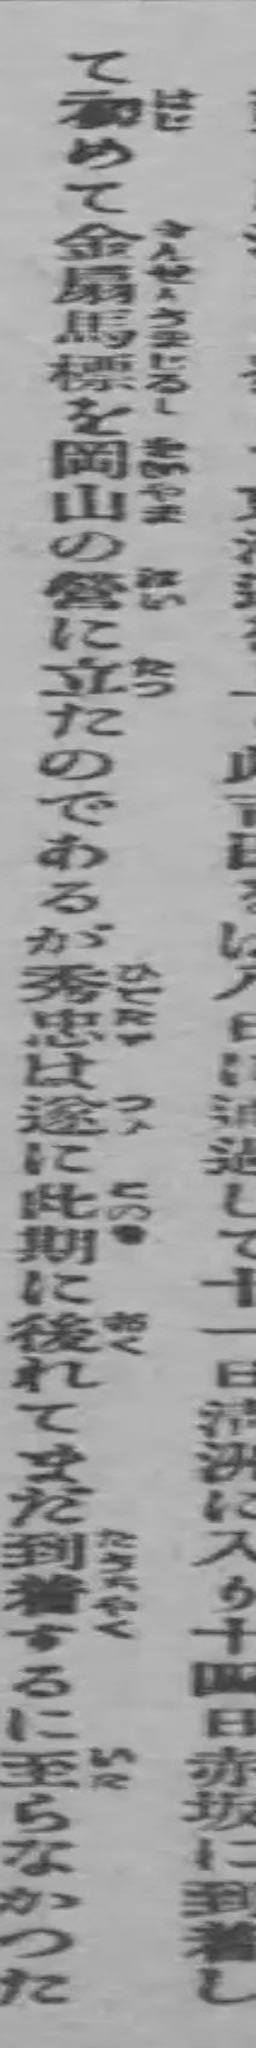て初めて金扇馬標を岡山の営に立たのであるが秀忠は遂に此期に後れてまだ到着するに至らなかつた
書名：豊橋市史談
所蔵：国立国会図書館 National Diet Library, JAPAN
